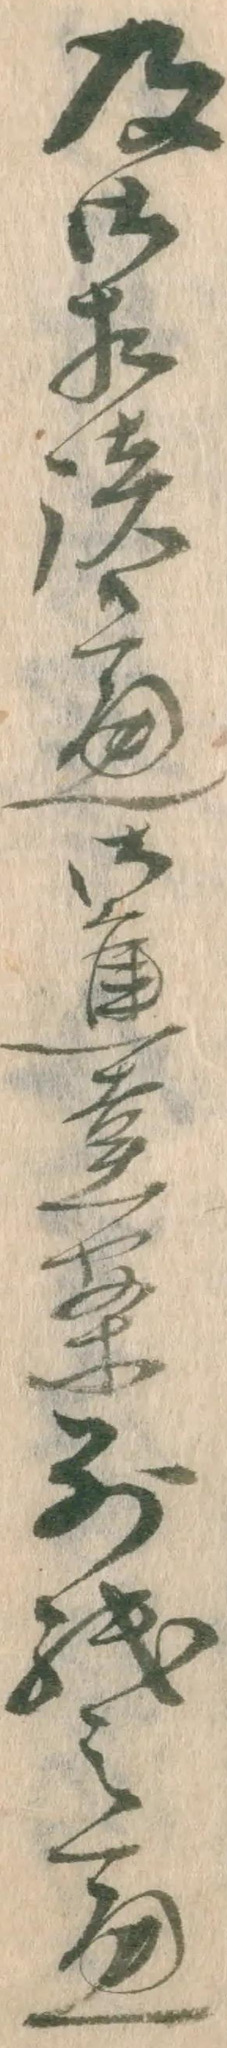及御相談候通御進達案別紙之通

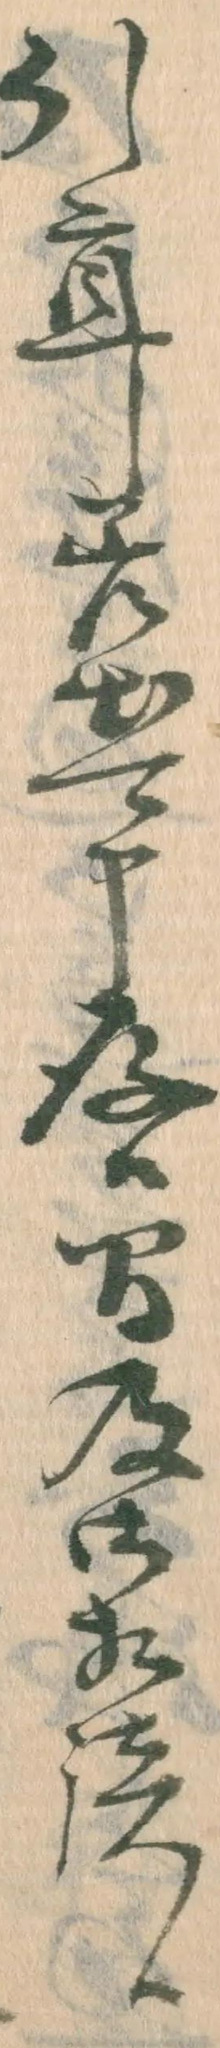引直し差出可申存候間及御相談候
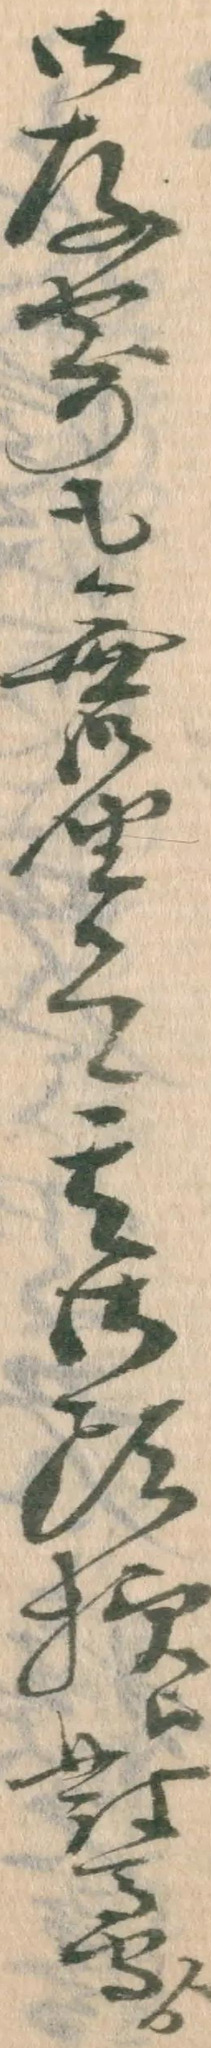御存寄も無御座候ハヽ其御頭様え対馬守ゟ
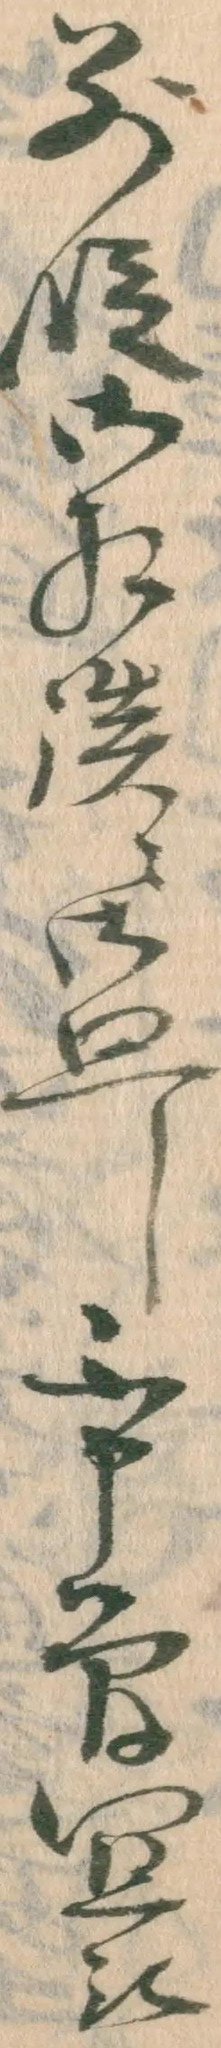別段御相談ニ御廻し不申候間宜被
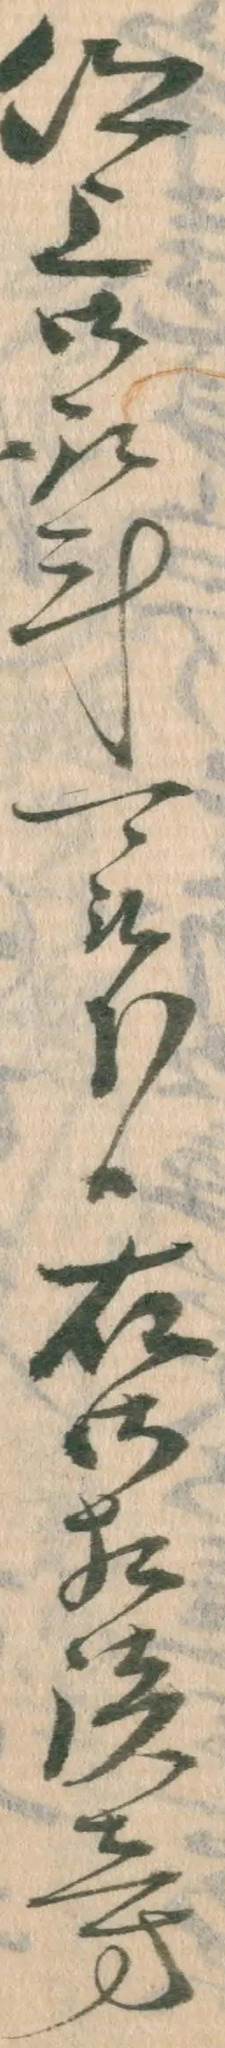仰上御取計可被下候右御相談旁
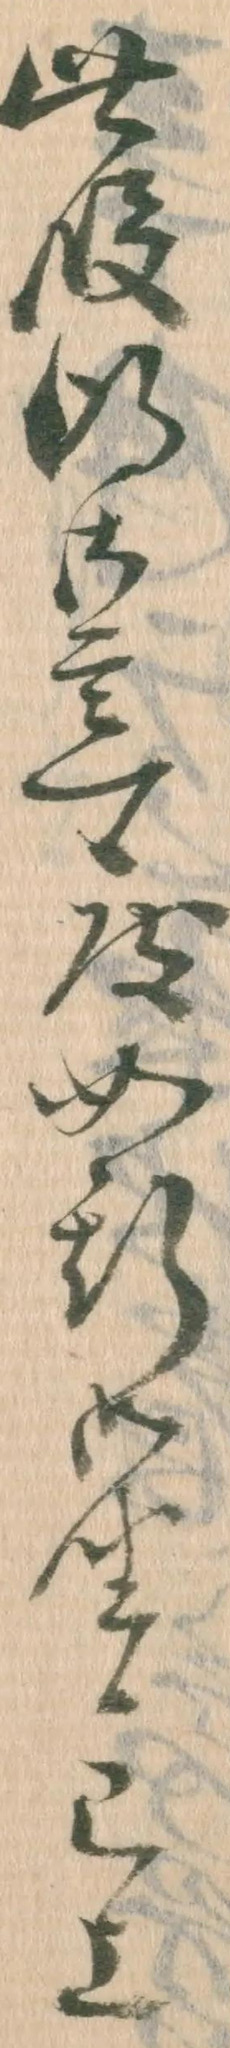此段得御意度如斯御座候已上
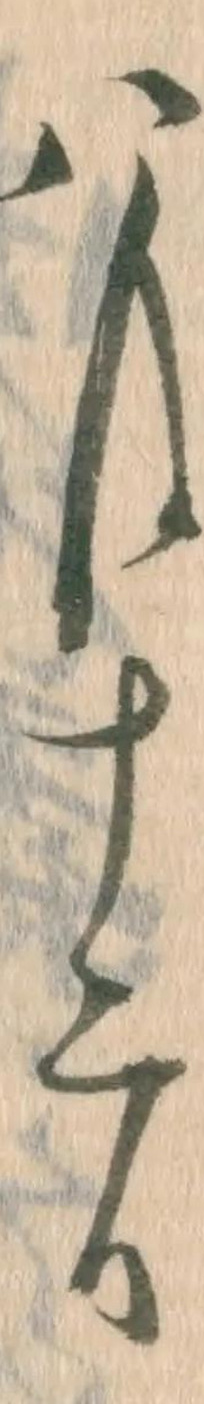八月十二日
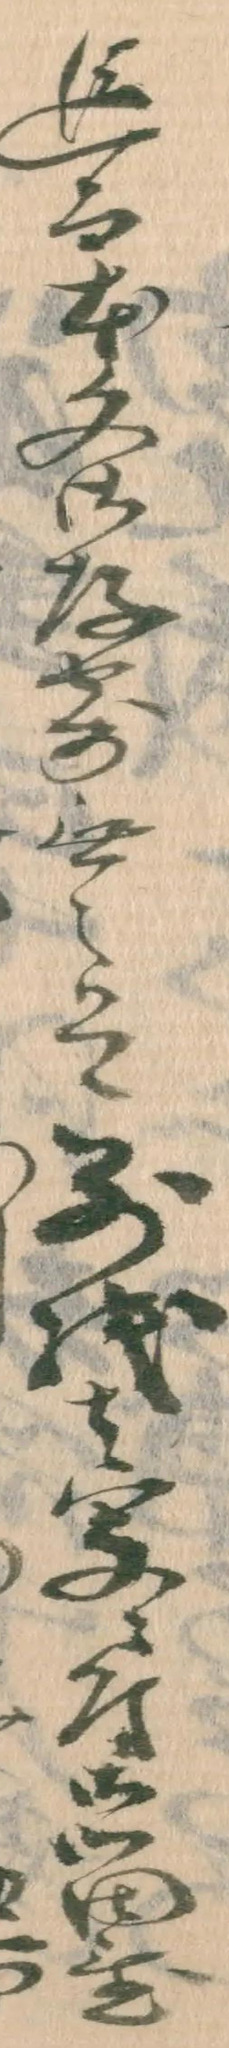追て本文御存寄無之候ハヽ別紙は写ニ付御留置
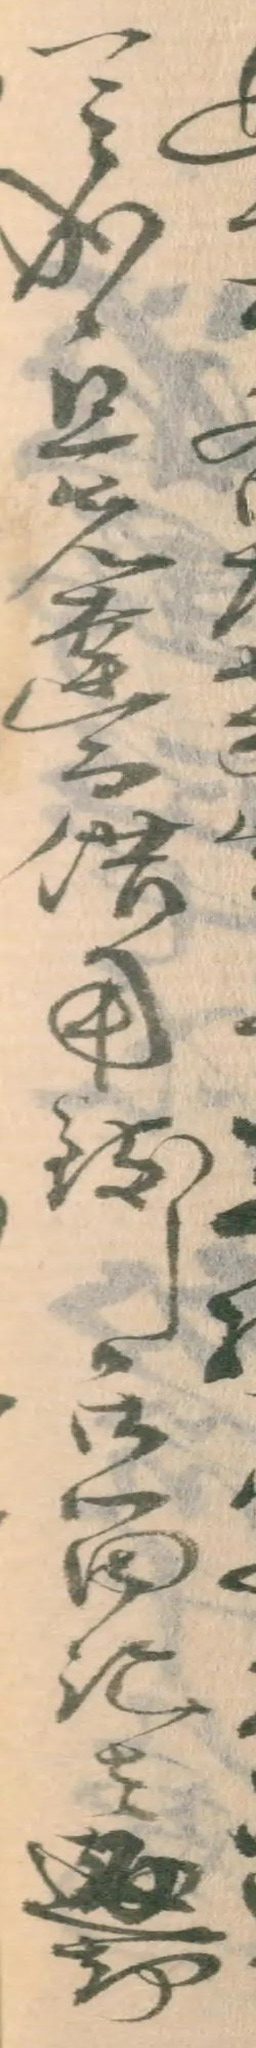可被成候且先達て借用致し候御留記は返却
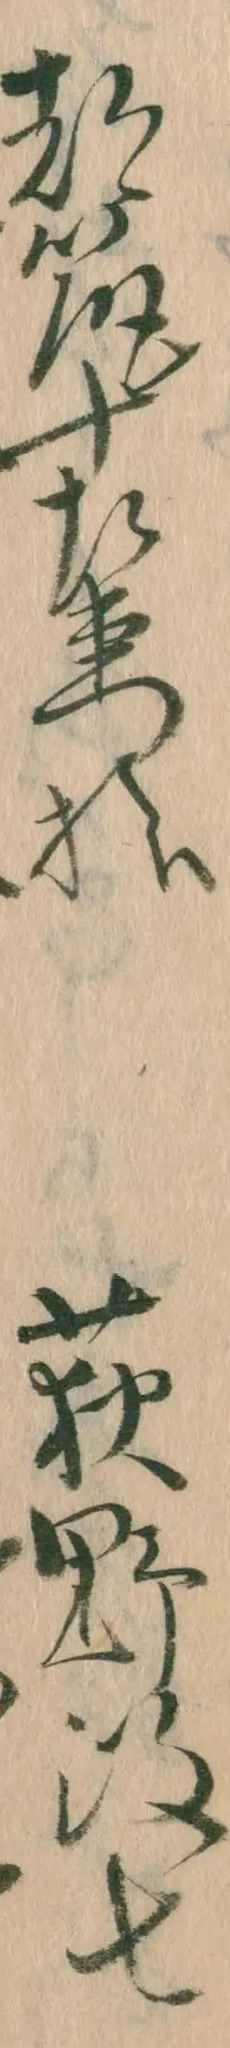都築十左衛門様荻野政七
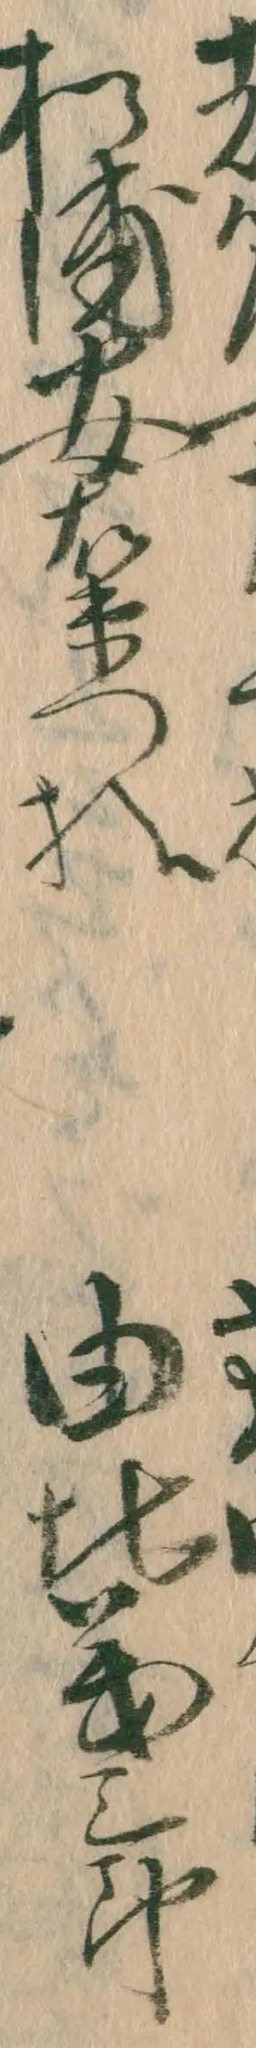松浦安右衛門様由比義三郎
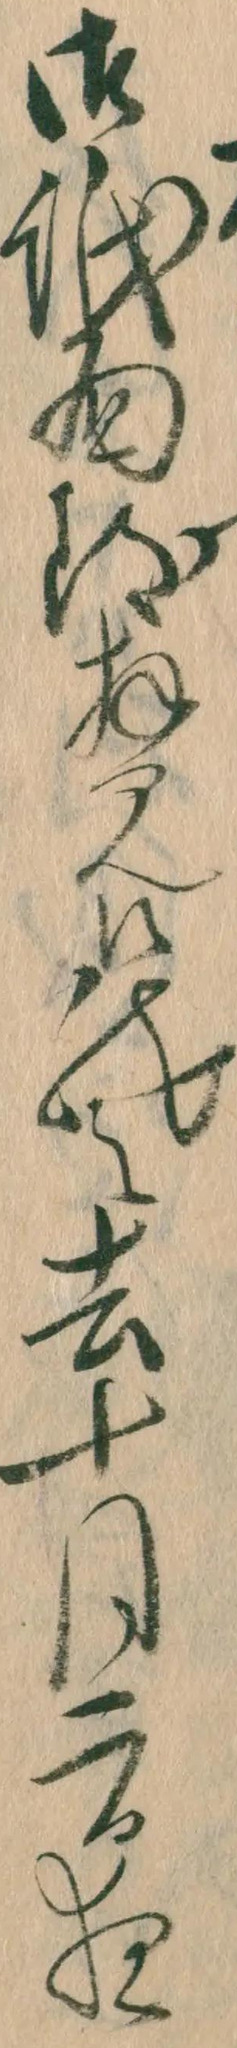御紙面致拝見候然は去十月二日夜
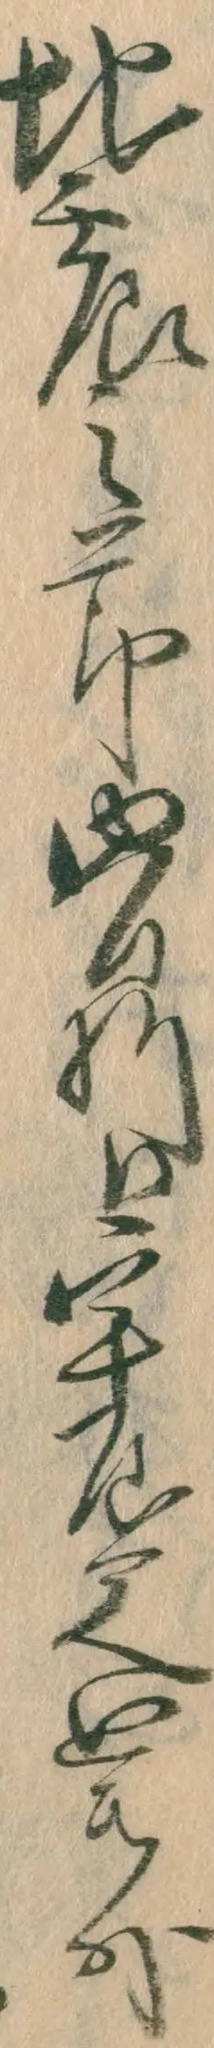地震之節骨折候牢屋見廻其外
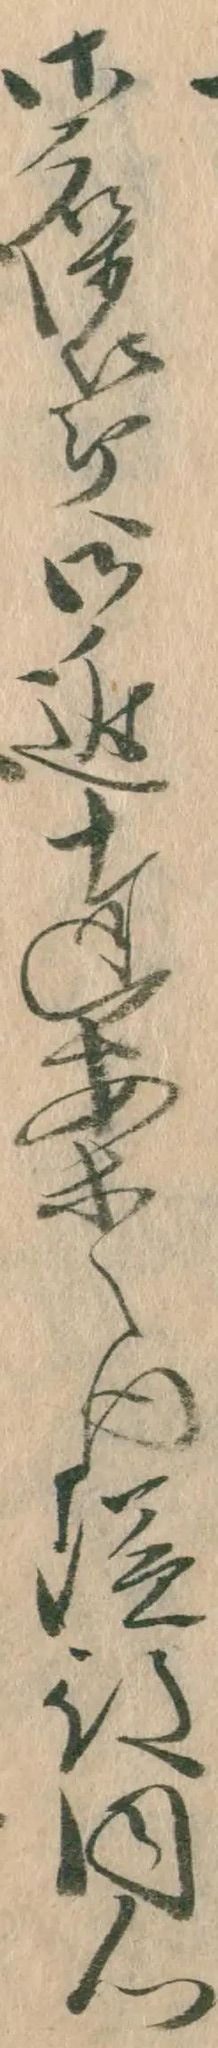御褒美御進達案之内鎰役同心
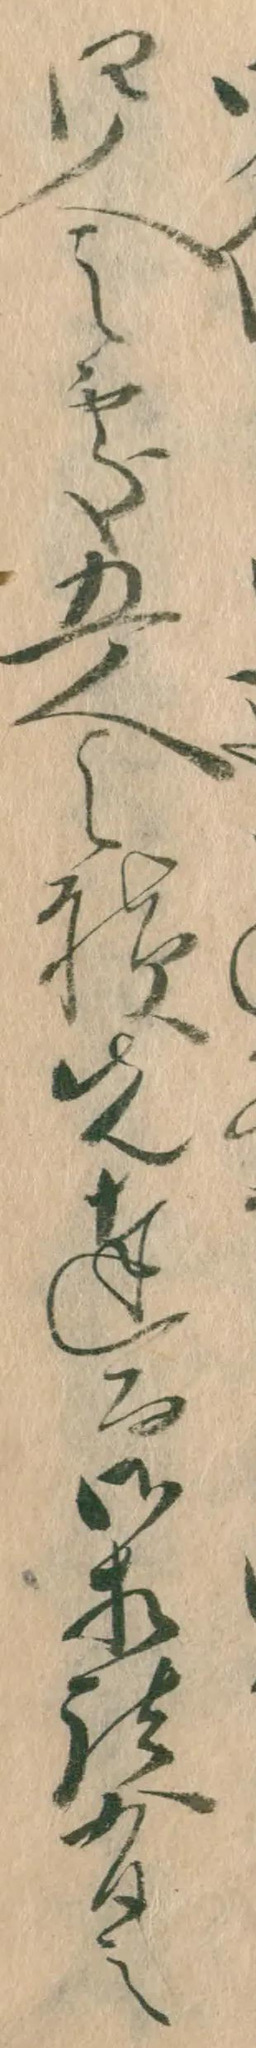四人之処五人之積先達て御相談有之

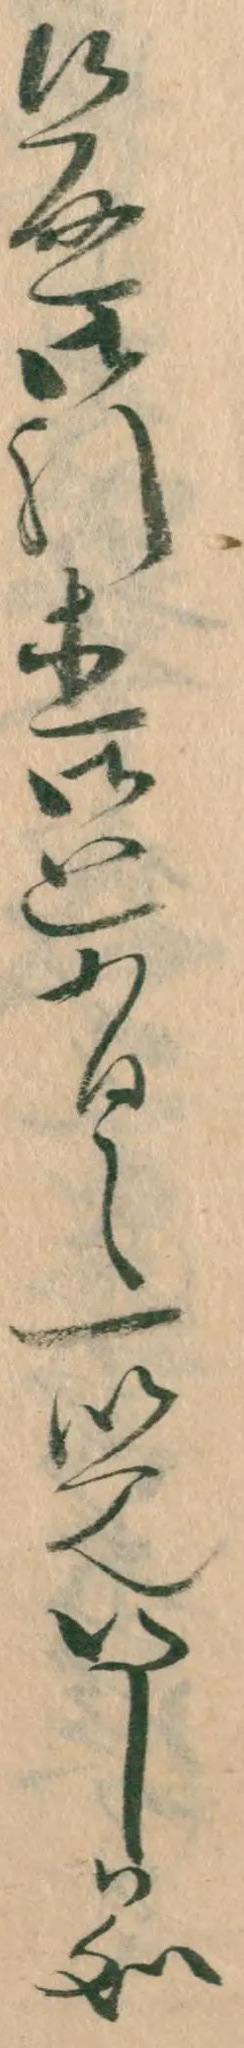候通御引直御廻有之一覧いたし候処
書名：七十冊物類集 71巻. [44] 四十三 牢屋敷御普請御修覆地震ニ付骨折候牢屋掛御褒美之部
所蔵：国立国会図書館 National Diet Library, JAPAN
